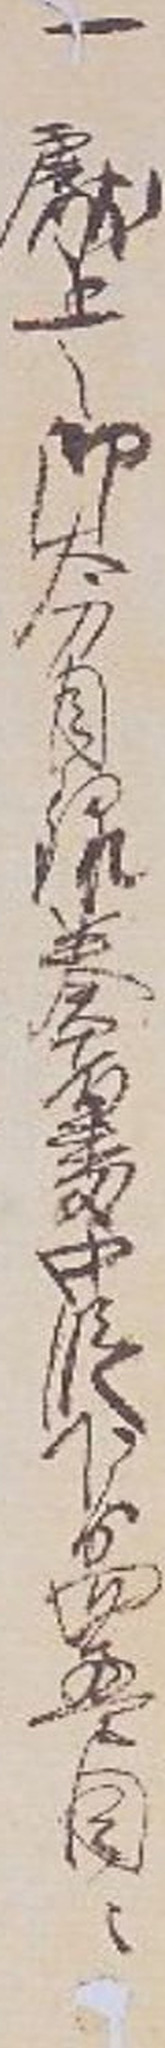一献上之御太刀目録奏者番中段下ゟ四畳目に
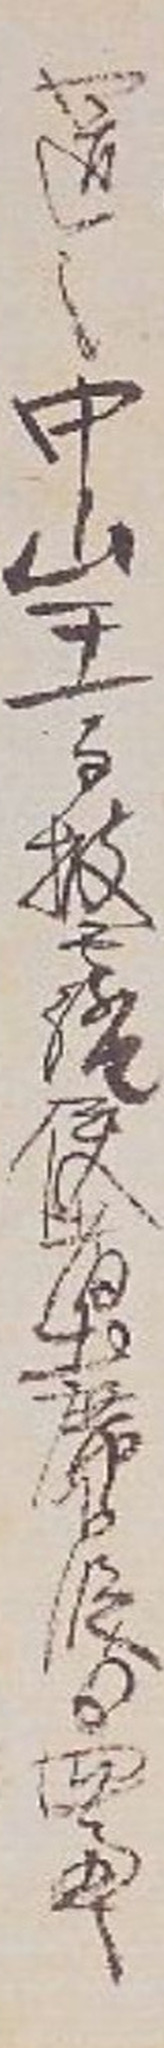置之中山王と披露使者出席下段ゟ四畳
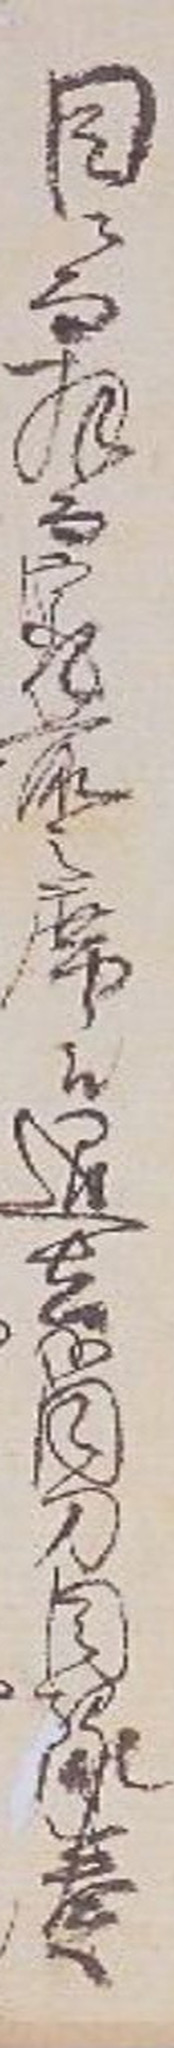目に而拝而最前之席え退去御目刀目録奏
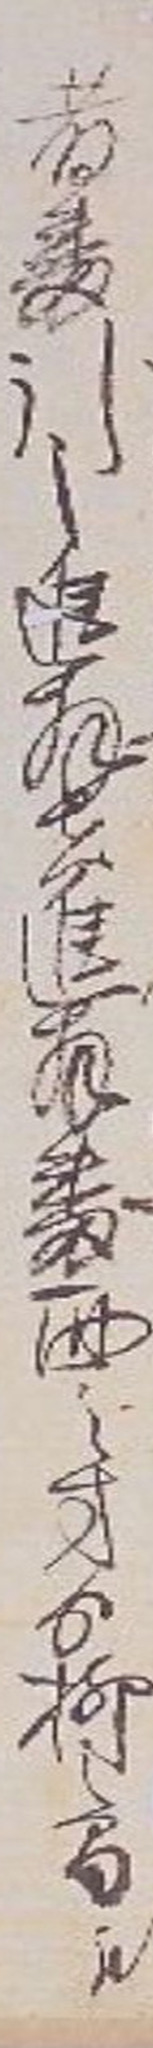者番引之進物は進物番西之方ゟ柳之間え

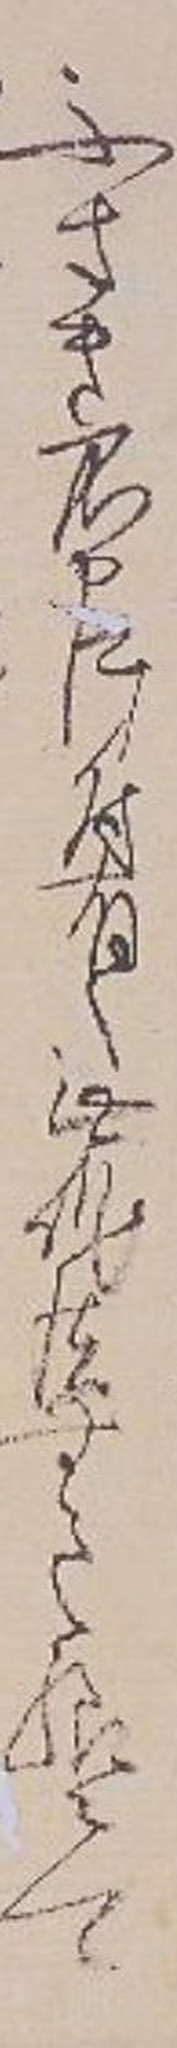ふさき不申片付有之無作法無之候様に可
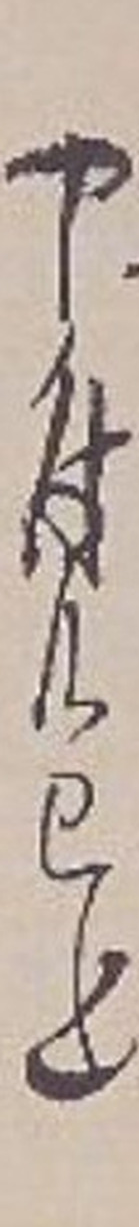申付候已上
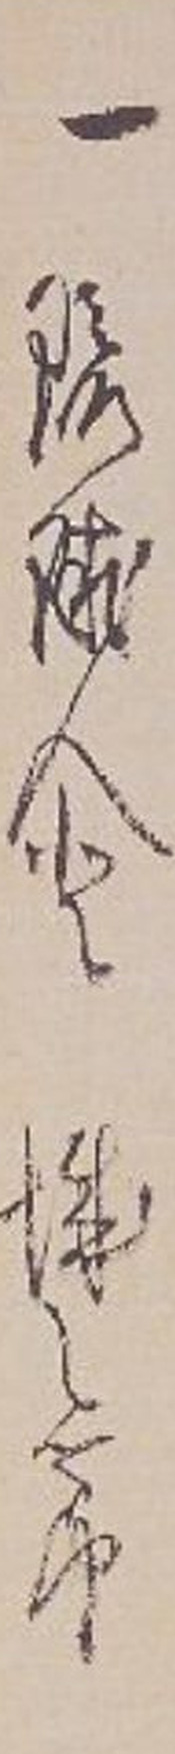一琉球人登城之節
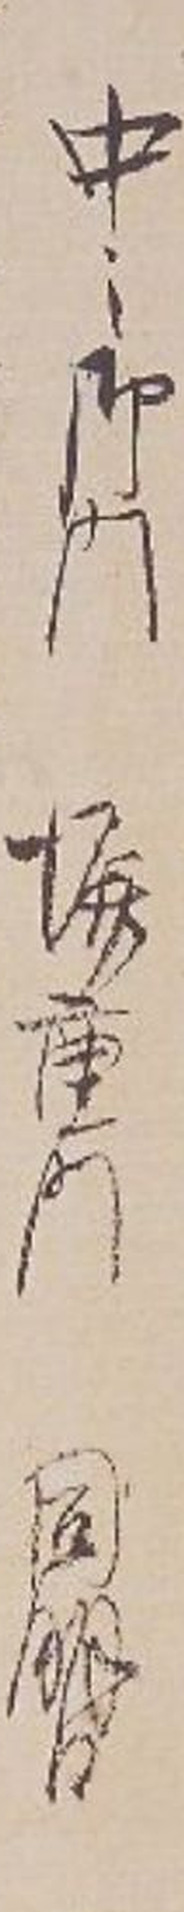中之御門塀重門同朋口
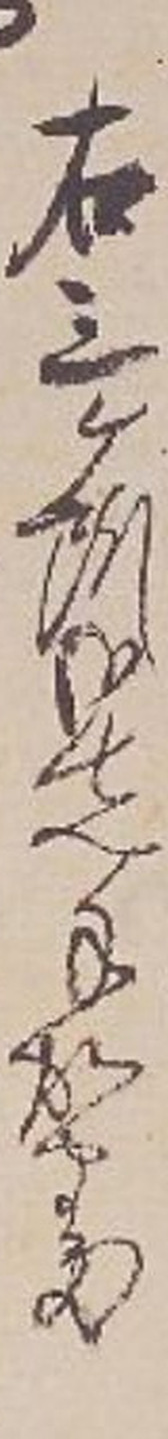右三ヶ所御先手加番
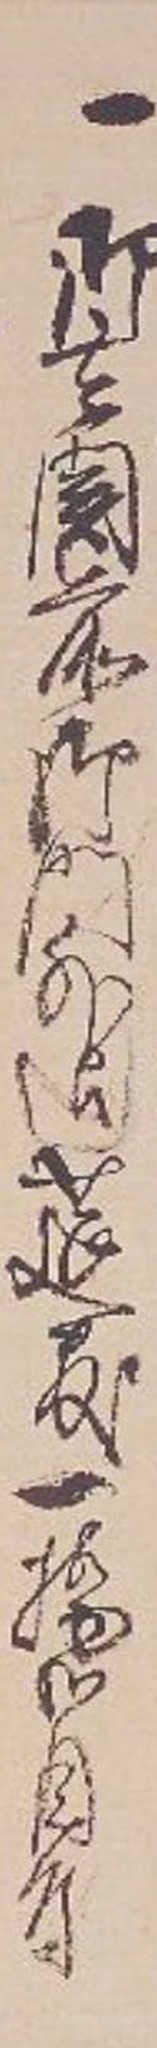一御玄関前御門外迄莚敷一橋御目付
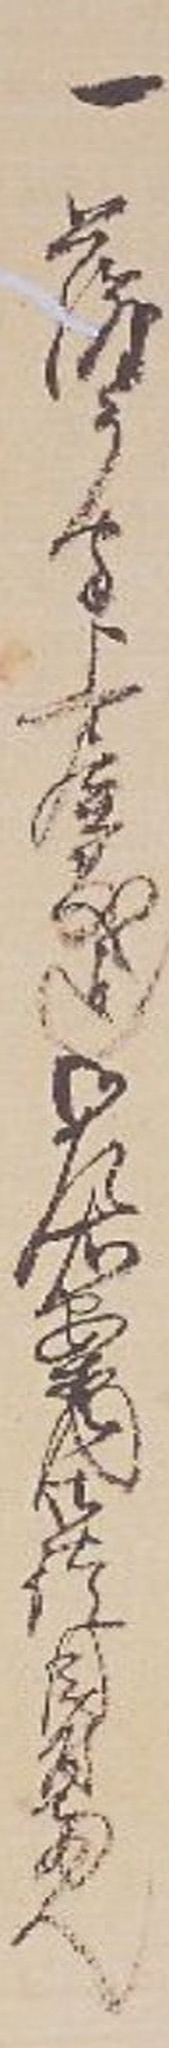一薩摩守上屋敷迄御左右案内御徒目付両人
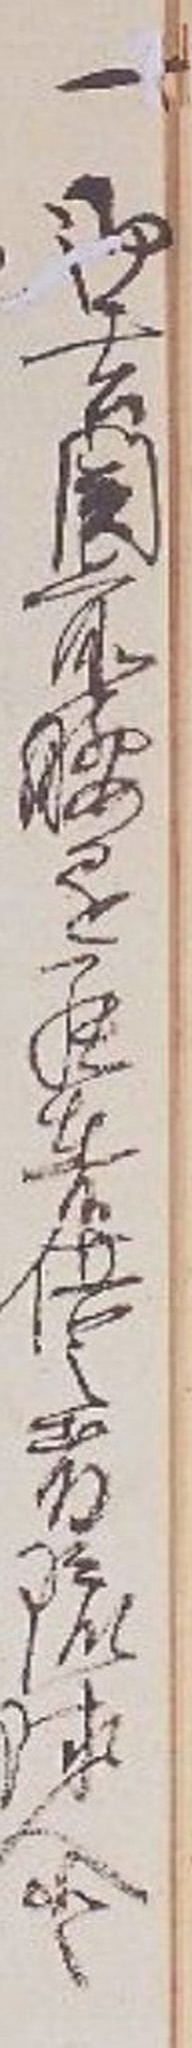一御玄関前腰懸罷在候供之者琉球人登
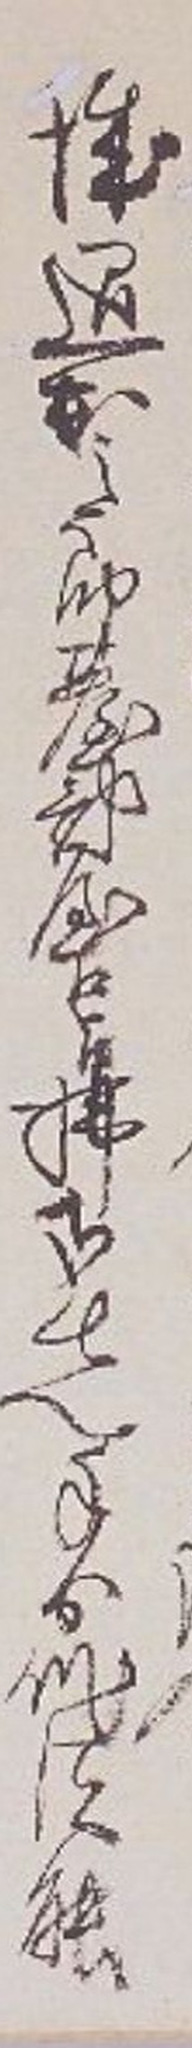城退出之節台部屋え被払御先手ゟ作法能
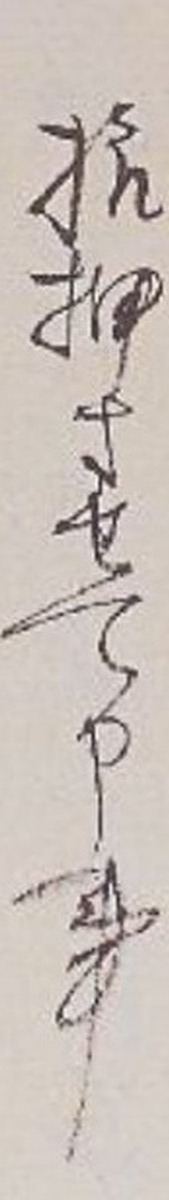様押させ可申事
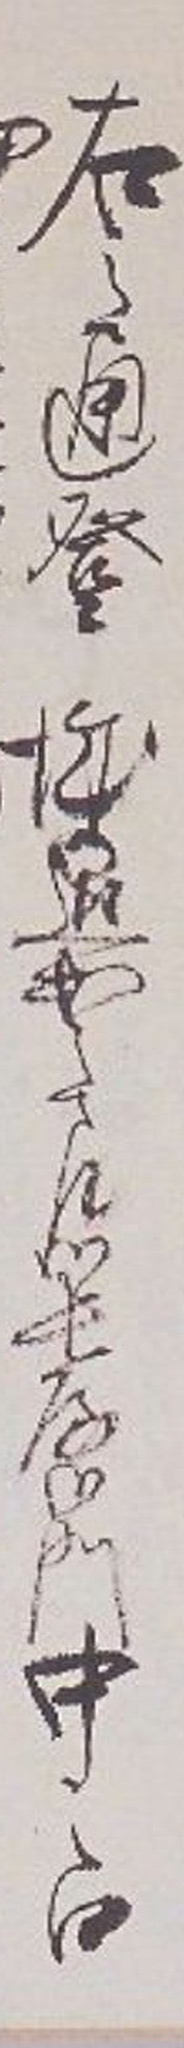右之通登城退出之節御長屋御門中之口
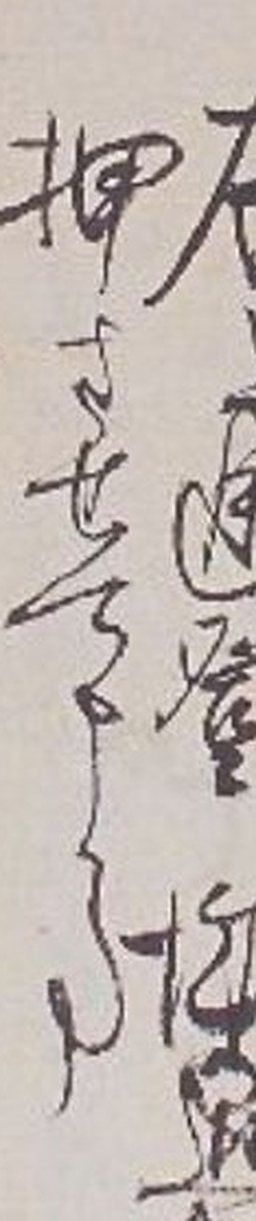押させ可申事
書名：宝永七年 琉球人来聘
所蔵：University of the Ryukyus Library
